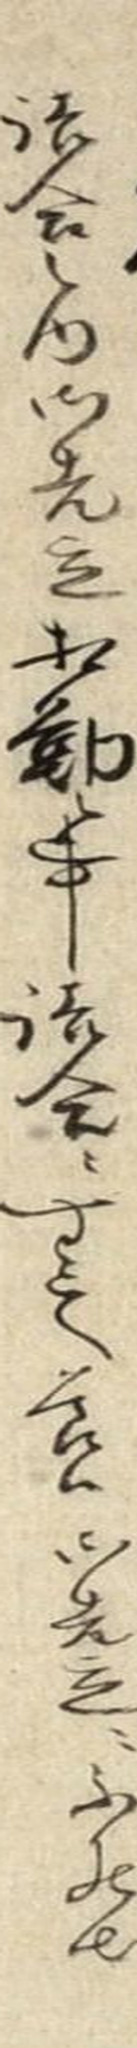詰合之内御先立相勤候事詰合に無之節は御先立に不罷出
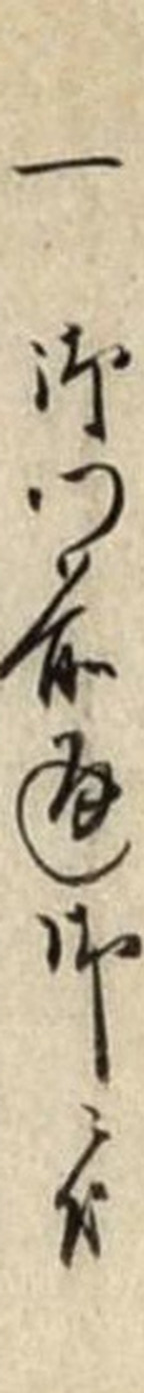一御門前通御に付
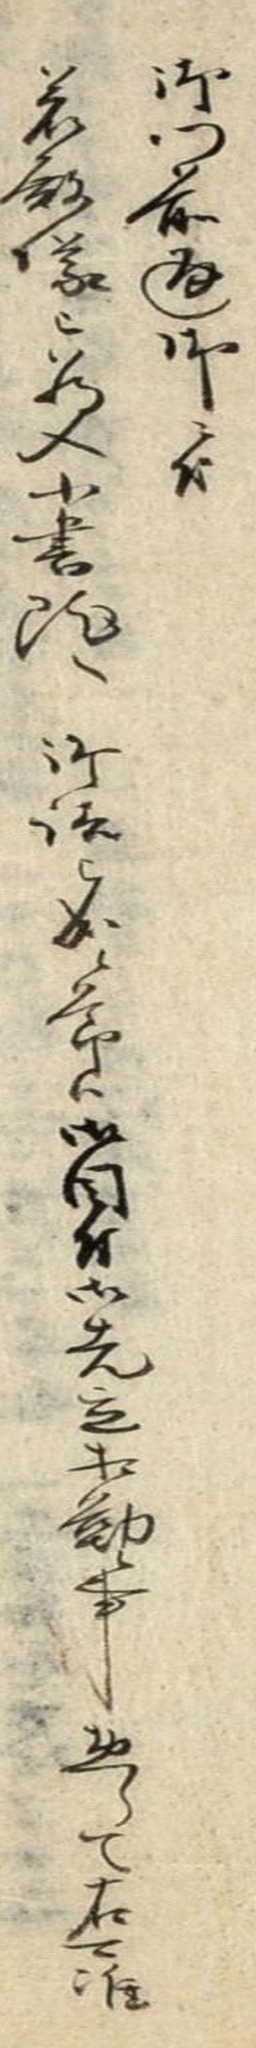若殿様被為入小書院へ御詰被成候節は御目付御先立相勤候事惣して右可准
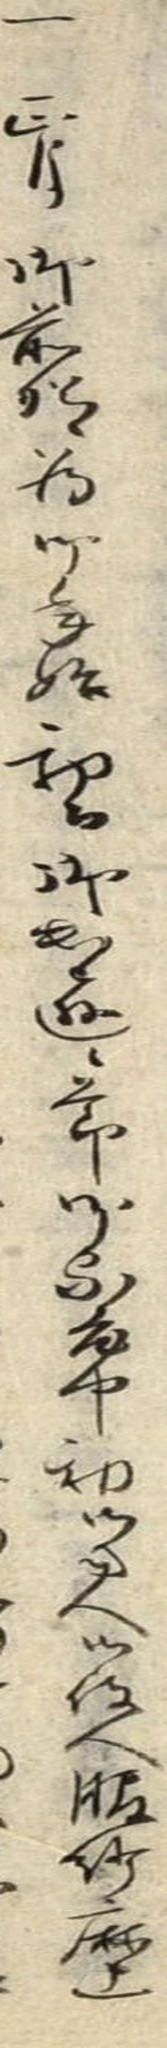一正月御前様為御年始初て御出被遊候節御家老中初御用人御役人服紗麻上
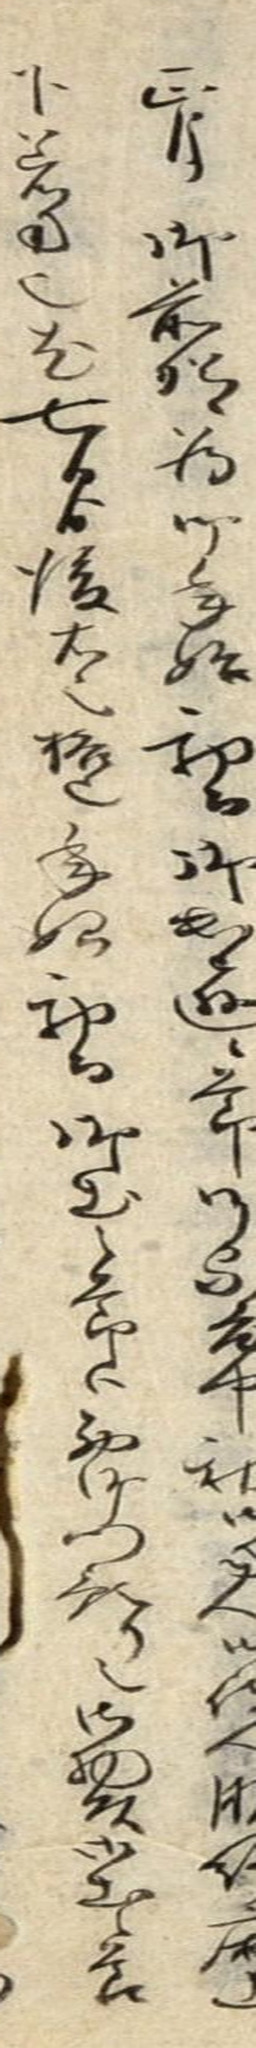下着用也尤七日ゟ後右之格也年始初て御出之節は西御門預り之御物頭御出候節
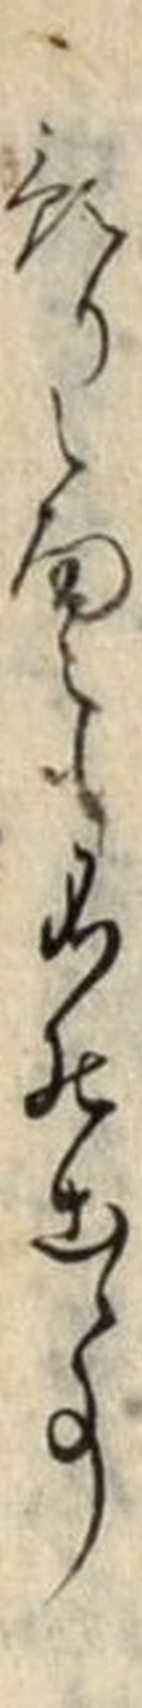預り之面々も不罷出候事

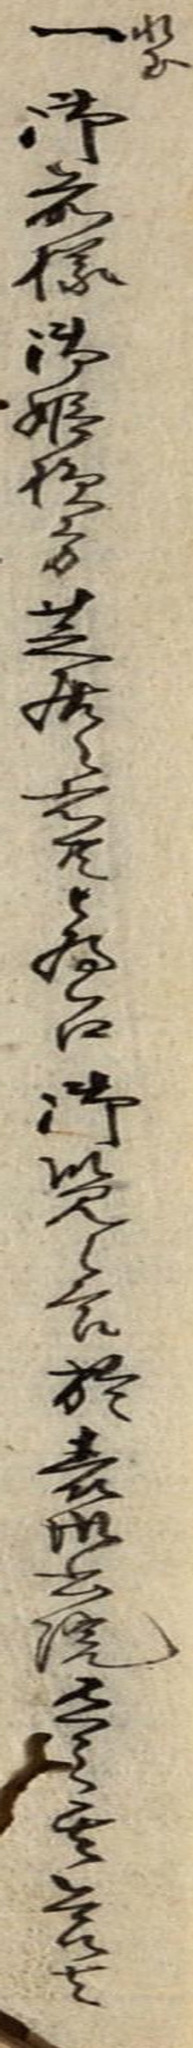一御前様御姫様方芝居之者共被為召御覧之節於表御書院有之其節は
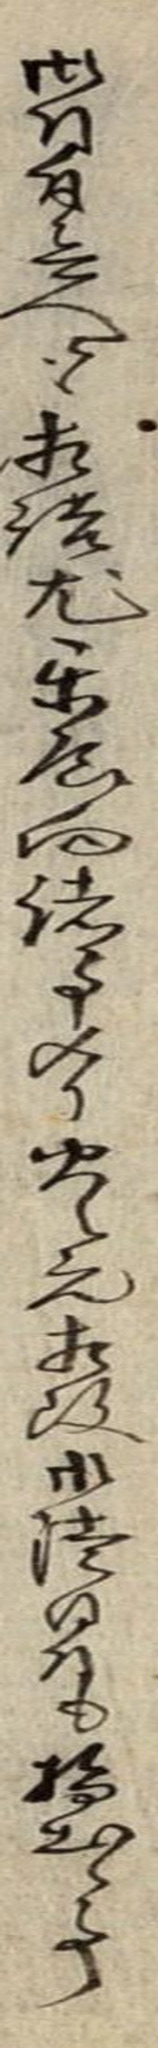御目付壱人ツヽ相詰尤楽屋向諸事〆り火之元相改御徒目付も指出候事
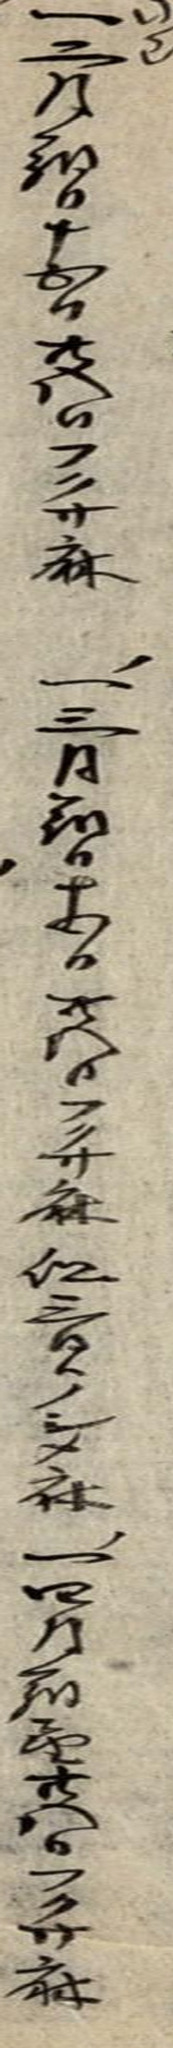一二月朔日十五日廿八日フクサ麻一三月朔日十五日廿八日フクサ麻但三日はノシメ麻一四月朔望廿八日フクサ麻
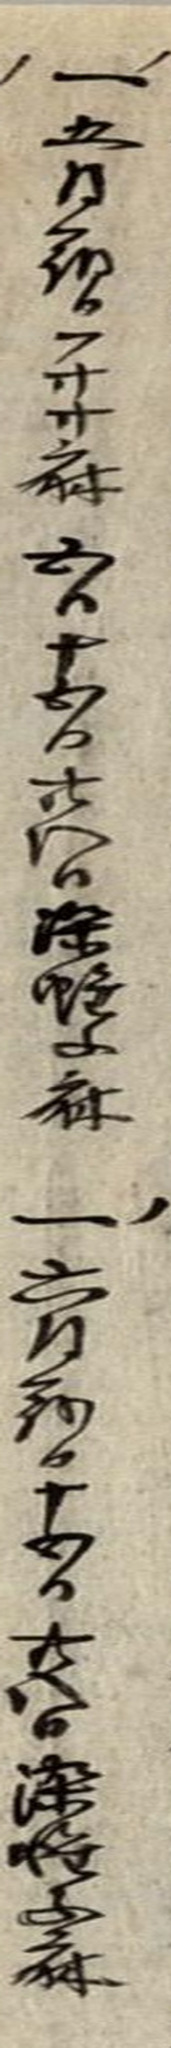一五月朔日フクサ麻五日十五日廿八日染帷子麻一六月染朔日十五日廿八日帷子麻
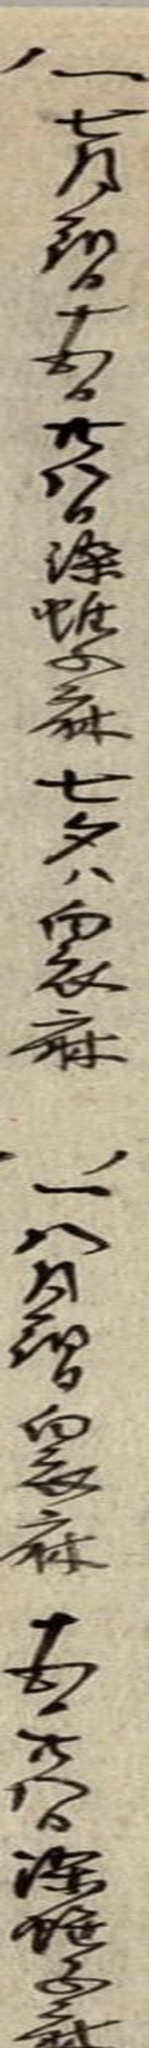一七月朔日十五日廿八日染帷子麻七夕は白衣麻一八月朔日白衣麻十五日廿八染帷子麻
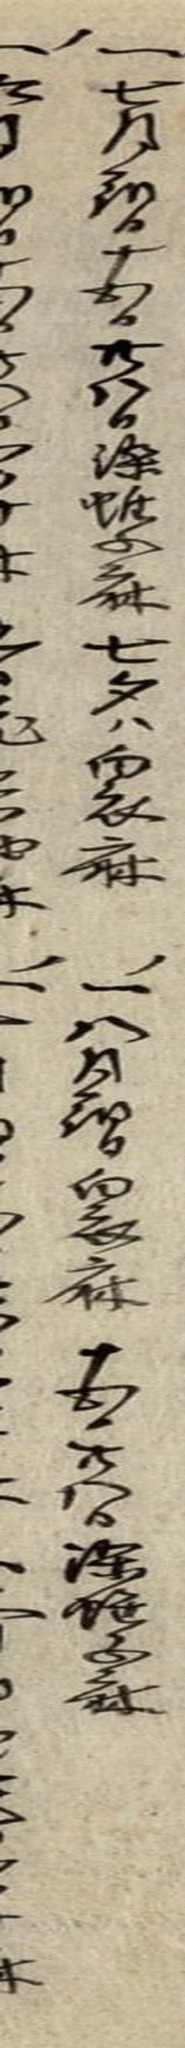一七月朔日十五日廿八日染帷子麻七夕は白衣麻一八月朔日白衣麻十五日廿八染帷子麻
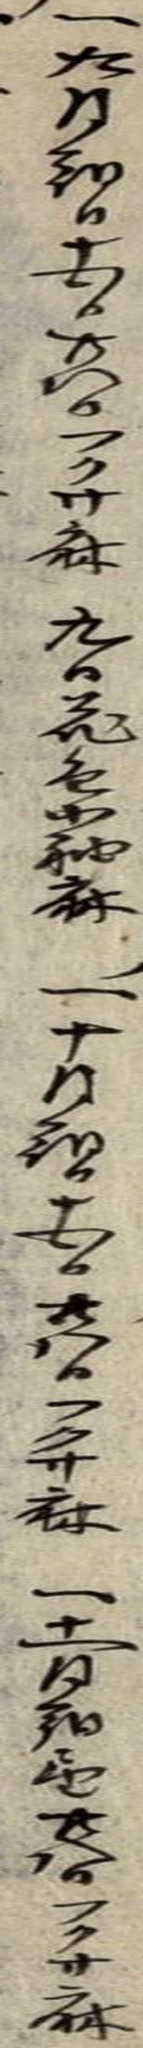一九月朔日十五日廿八日フクサ麻九日花色小袖麻一十月朔日十五日廿八日フクサ麻一十一月朔望廿八日フクサ麻

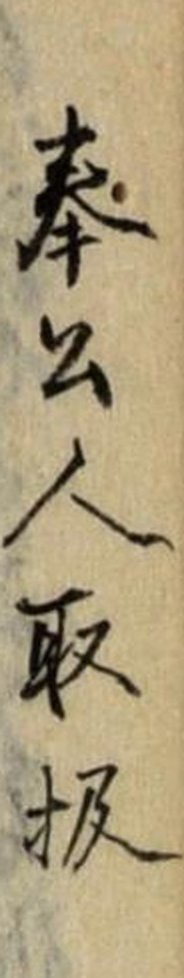奉公人取扱
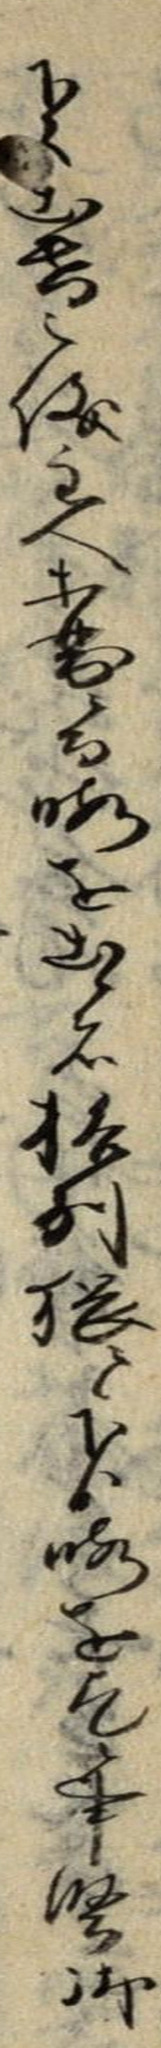一下々出替之儀主人相対にて暇を出候者格別猥に候下ゟ暇を乞候事堅御
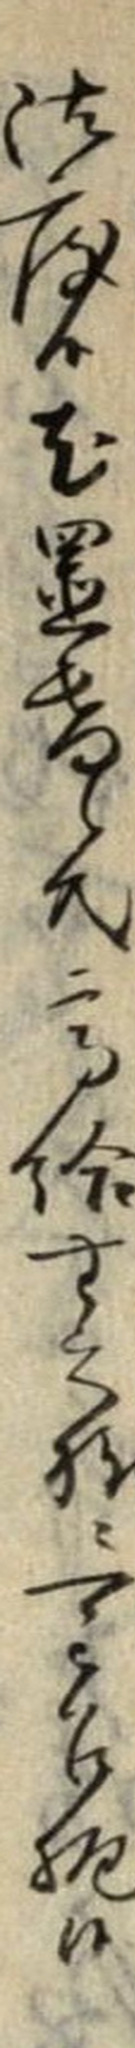法度候尤置替候共高給無之様に可被召抱候
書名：三都并道中之部
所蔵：福井県文書館 Fukui Prefectural Archives
